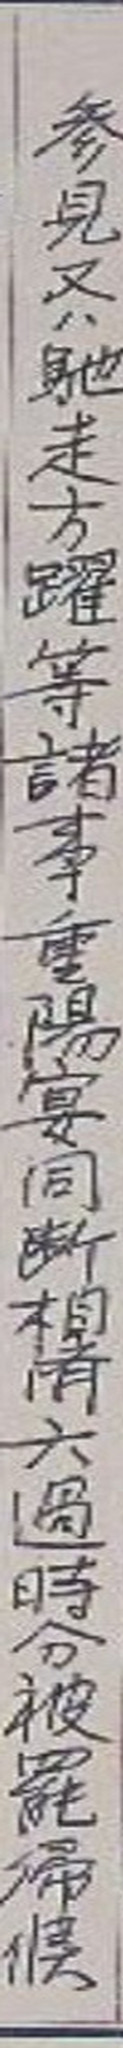参見又は馳走方躍等諸事重陽宴同断相済六過時分被罷帰候
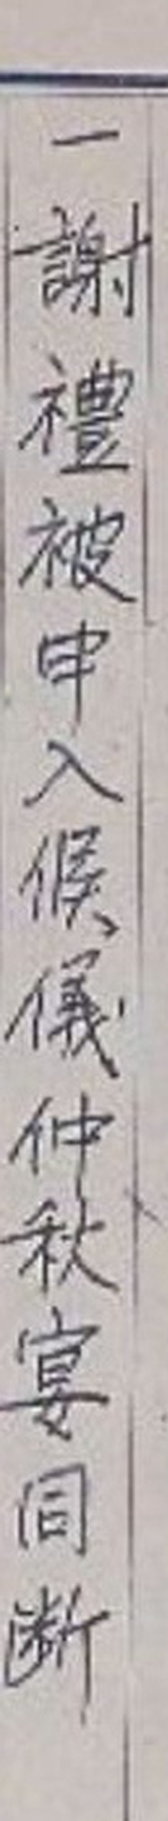一謝礼被申入候儀仲秋宴同断
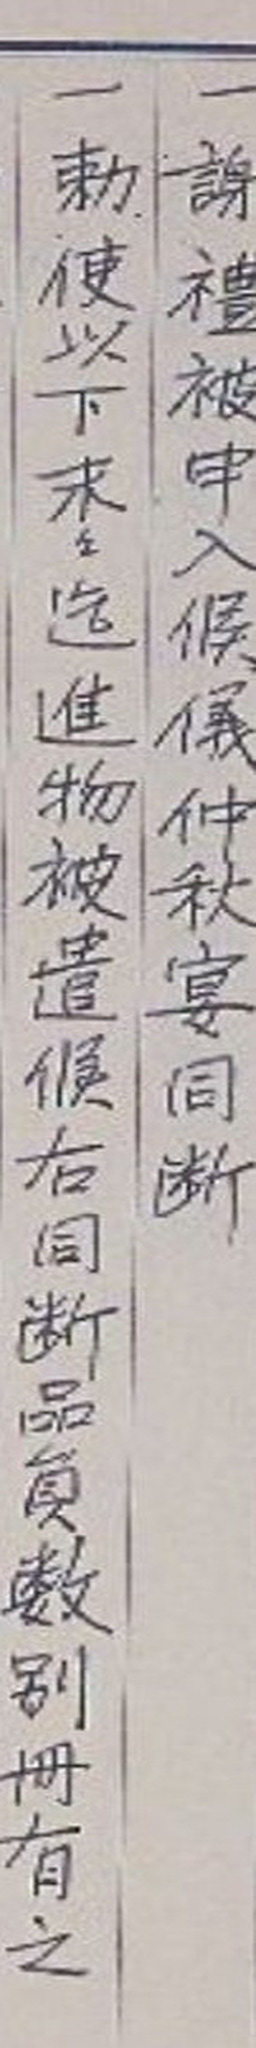一勅使以下末々迄進物被遣候右同断品員数別冊有之
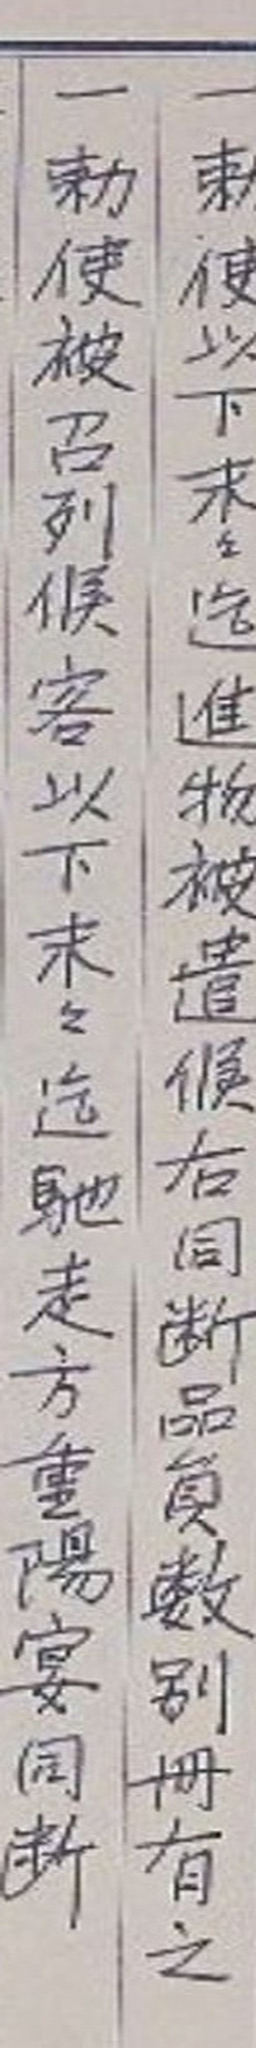一勅使被召列候客以下末々迄馳走方重陽宴同断
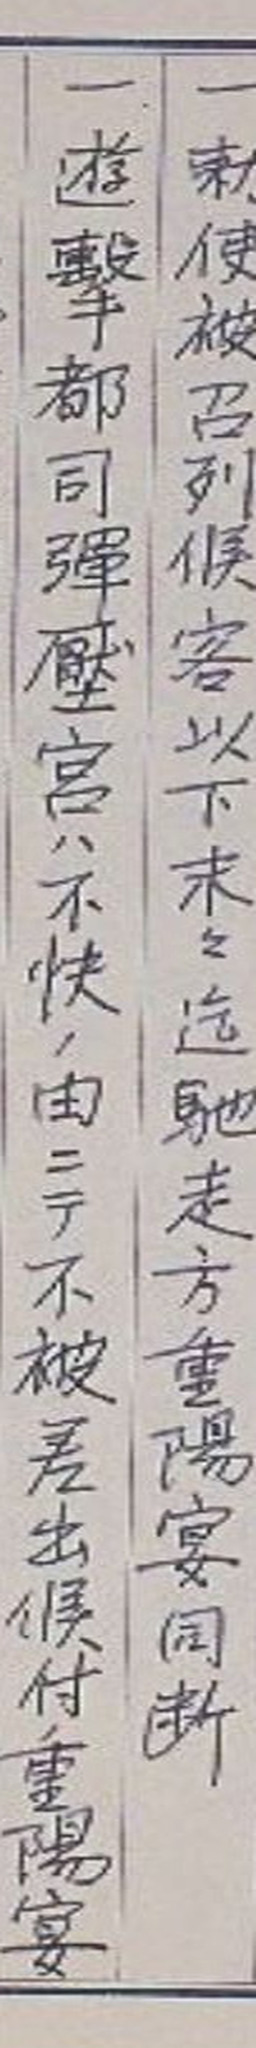一遊撃都司弾圧宮は不快の由にて不被差出候付重陽宴
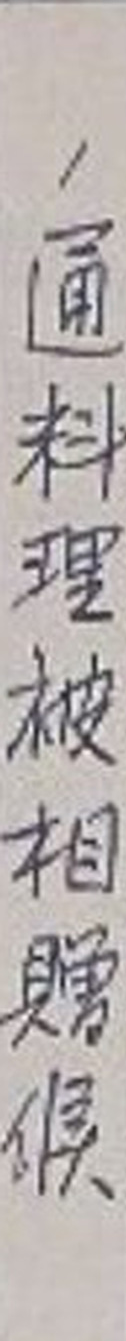の通料理被相贈候
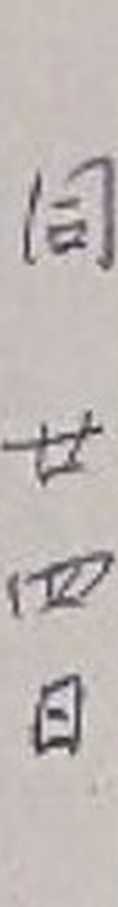同廿四日
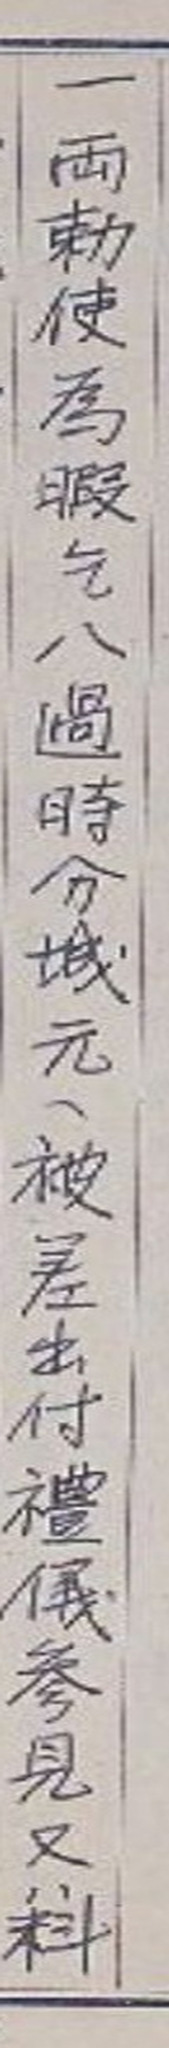一両勅使為暇乞八過時分城元へ被差出付礼儀参見又は料
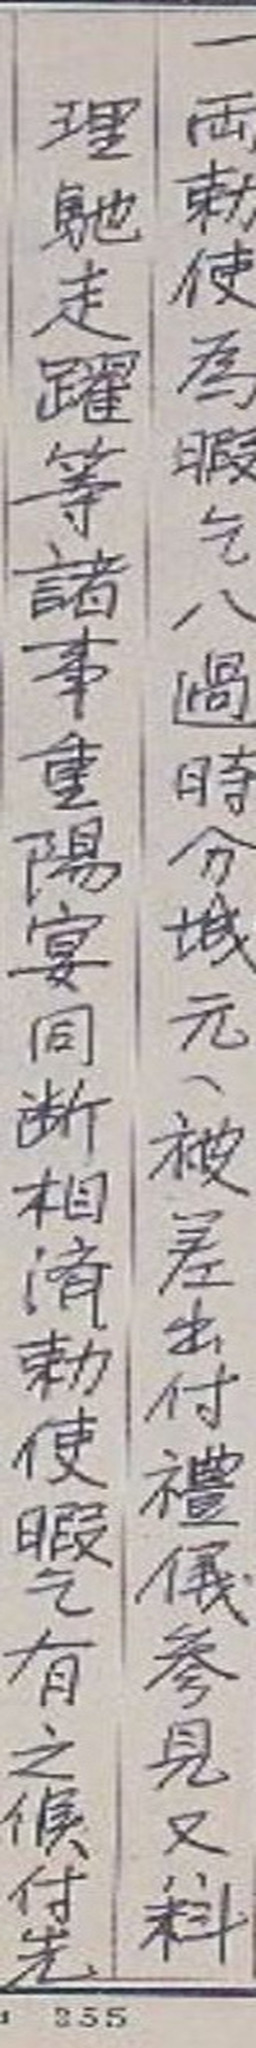理馳走躍等諸事重陽宴同断相済勅使暇乞有之候付先
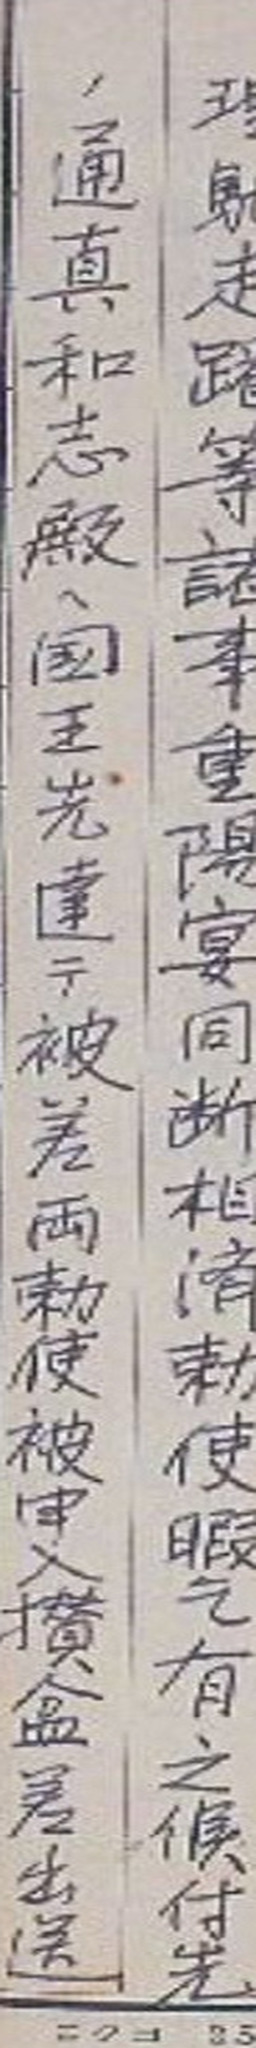の通真和志殿へ国王先達て被差両勅使被申入攅盆差出送
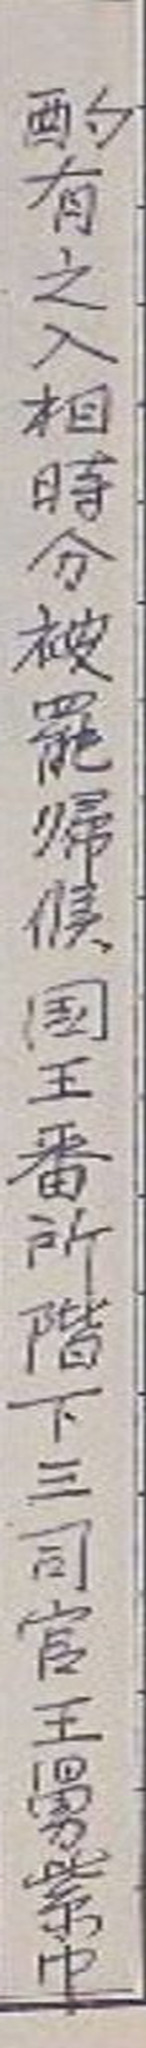酌有之入相時分被罷帰候国王番所階下三司官王舅紫巾
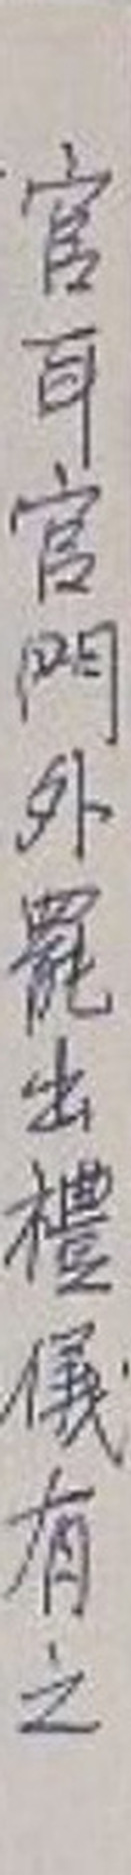官耳官門外罷出礼儀有之
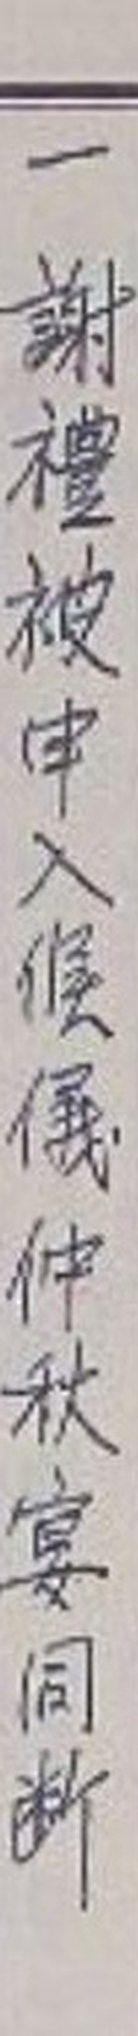一謝礼被申入候儀仲秋宴同断
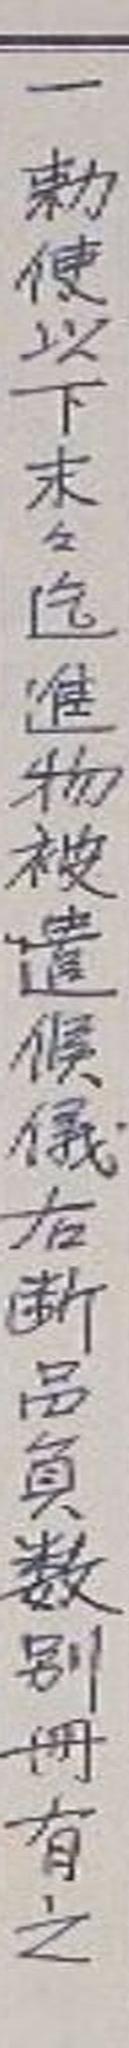一勅使以下末々迄進物被遣候儀右断品員数別冊有之
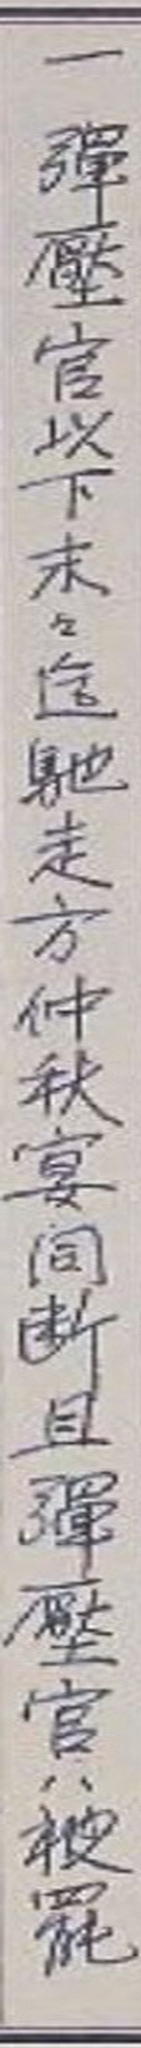一弾圧官以下末々迄馳走方仲秋宴同断且弾圧官は被罷
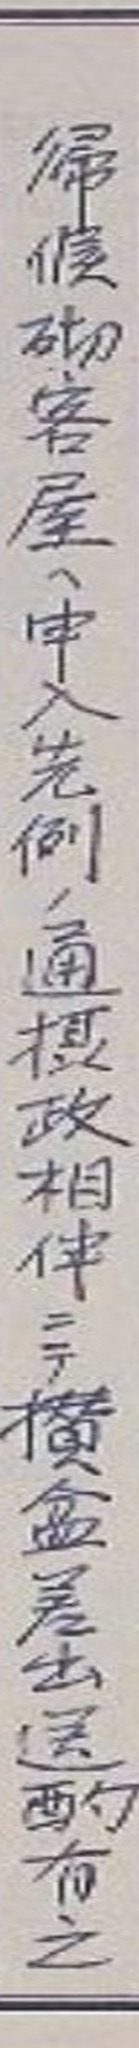帰候砌客屋へ申入先例の通摂政相伴にて攅盆差出送酌有之
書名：支那冊封使来琉諸記 下巻
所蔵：University of the Ryukyus Library
